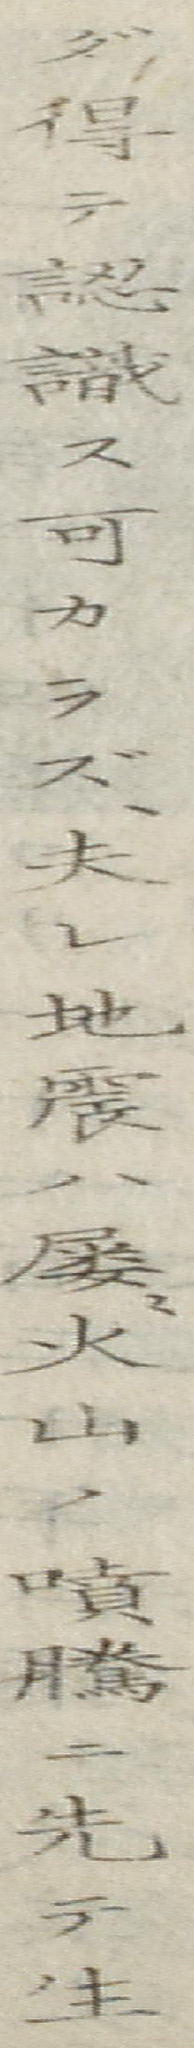ダ得テ認識ス可カラズ、夫レ地震ハ屡々火山ノ噴騰ニ先テ生
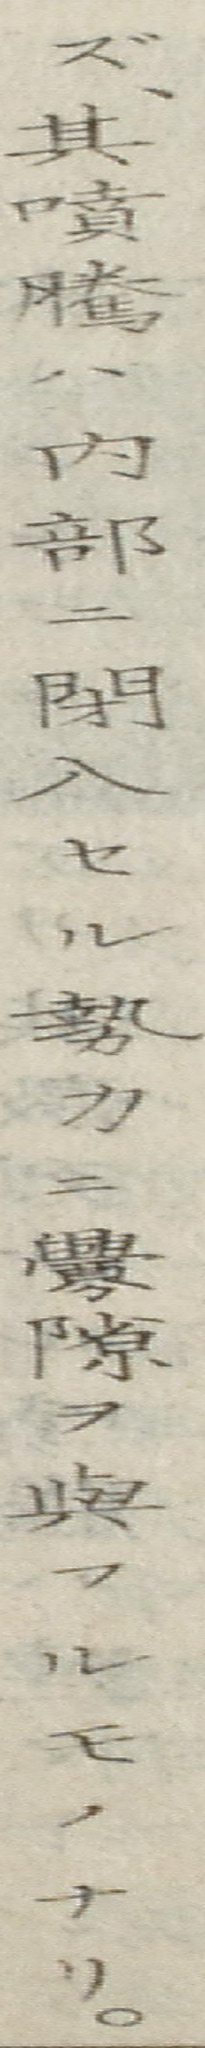ズ、其噴騰ハ内部ニ閉入セル勢力ニ釁隙ヲ與フルモノナリ。
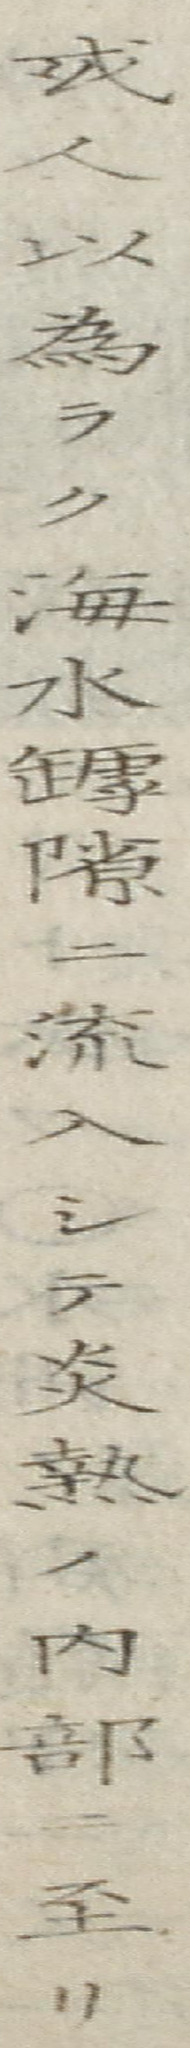或人以為ラク海水罅隙ニ流入シテ炎熱ノ内部ニ至リ
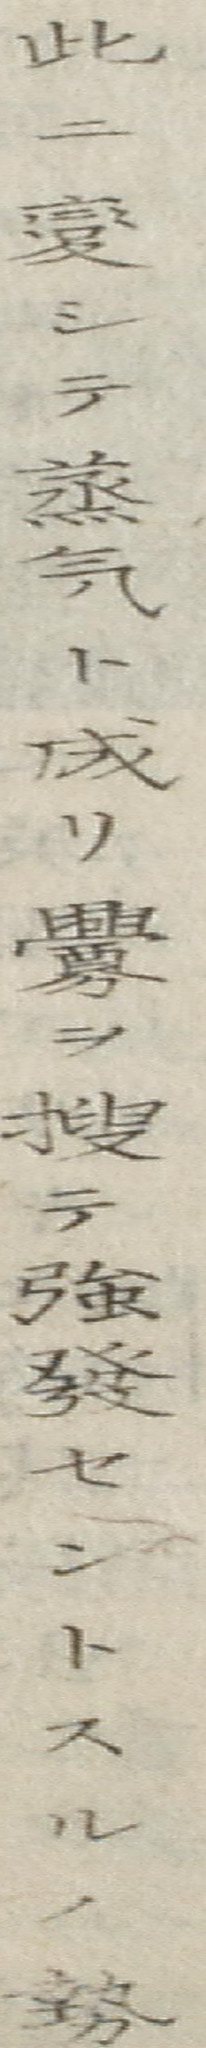此ニ変シテ蒸気ト成リ釁ヲ捜テ強發セントスルノ勢
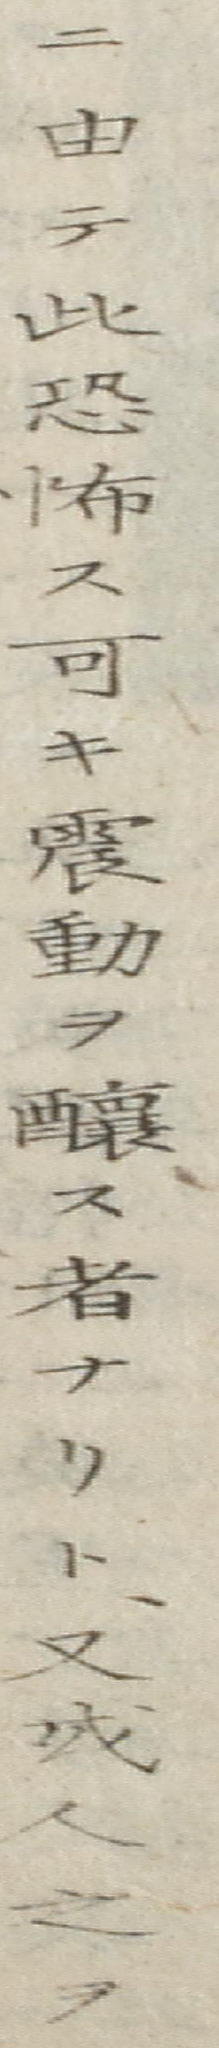ニ由テ此恐怖ス可キ震動ヲ醸ス者ナリト、又或人之ヲ
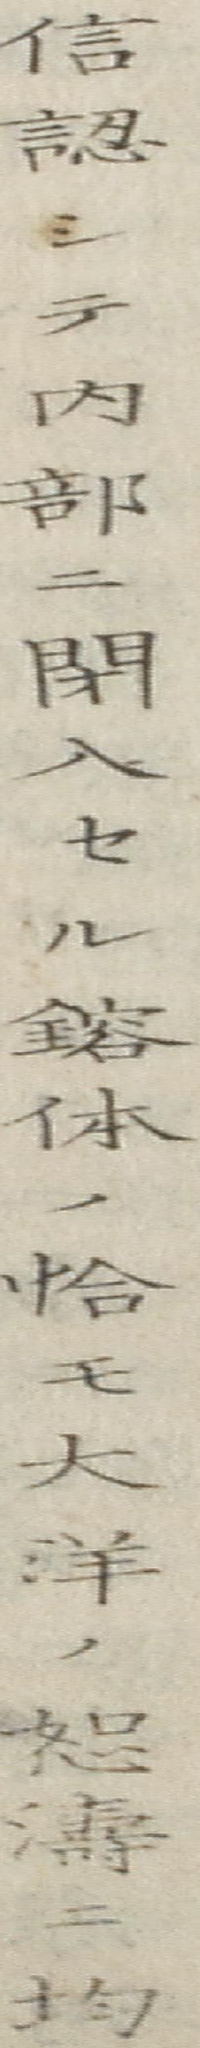信認シテ内部ニ閉入セル鎔体ノ恰モ大洋ノ怒濤ニ均
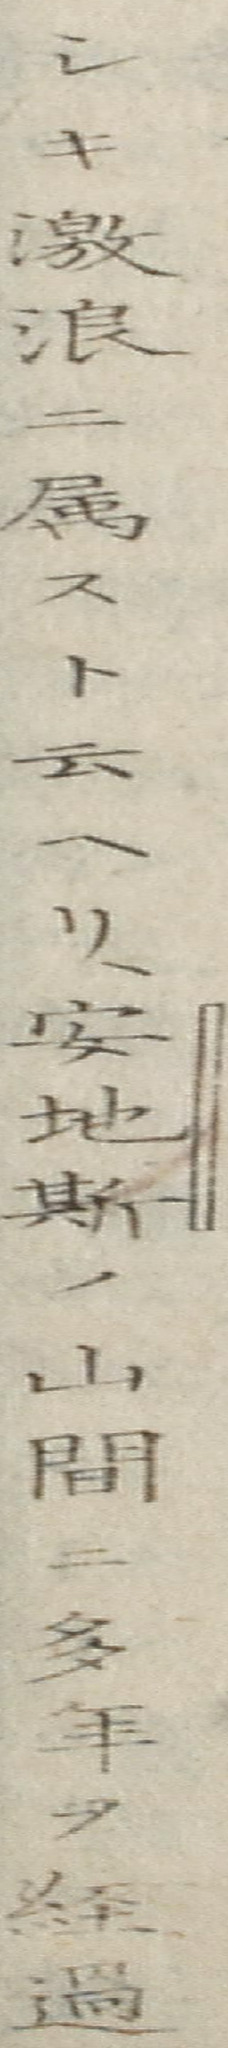シキ激浪ニ属スト云ヘリ、安地斯ノ山間ニ多年ヲ経過
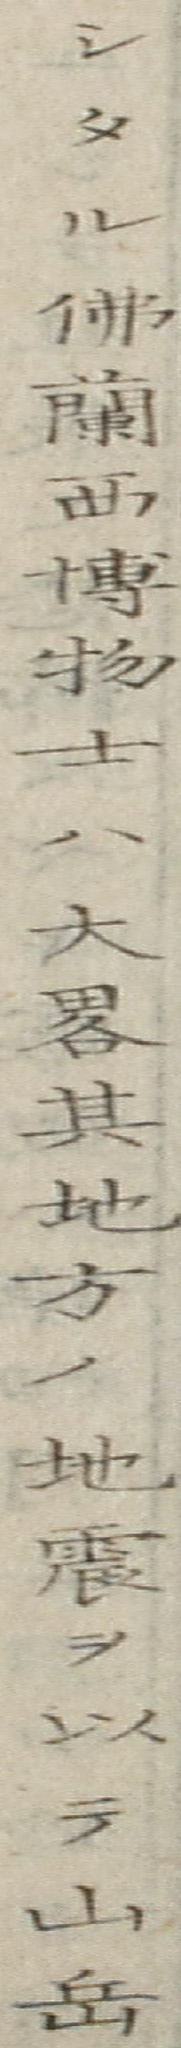シタル佛蘭西博物士ハ大略其地方ノ地震ヲ以テ山岳
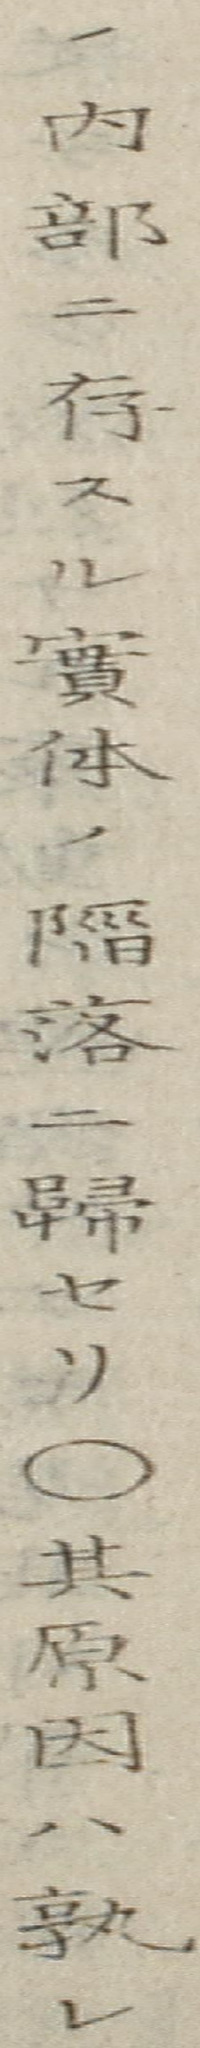ノ内部ニ存スル實体の陥落に帰セリ○其原因ハ孰レ
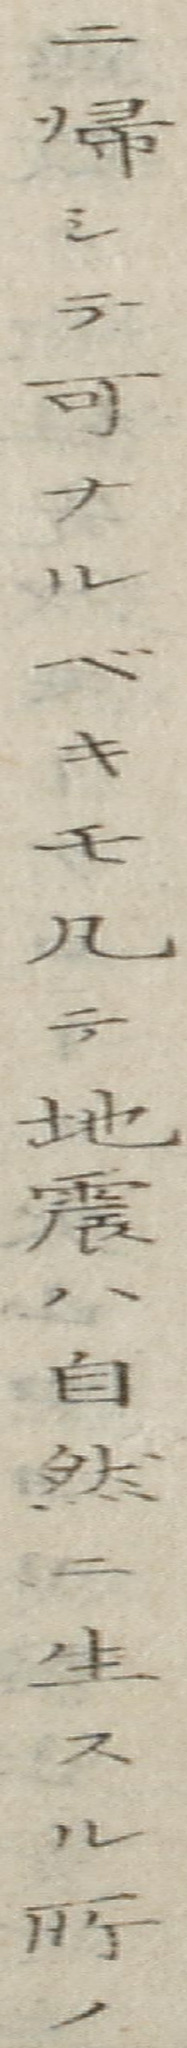ニ帰シテ可ナルベキモ凡テ地震ハ自然ニ生スル所ノ
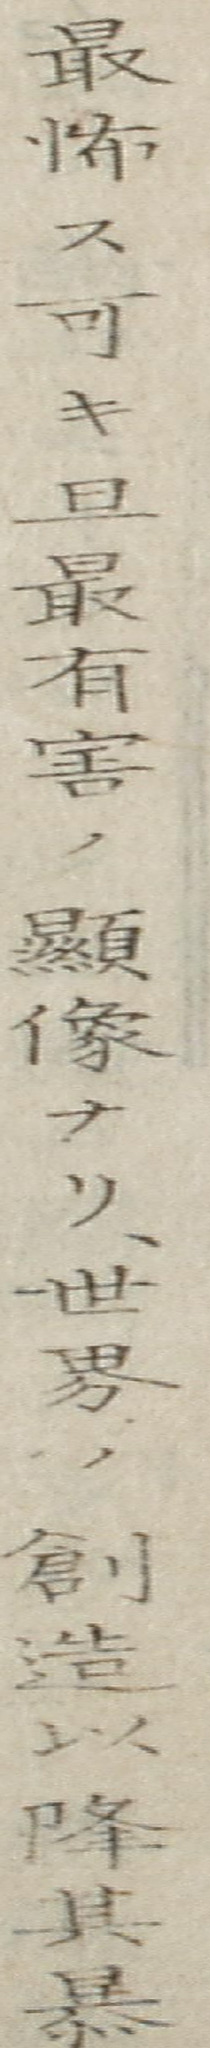最怖ス可キ旦最有害ノ顕像ナリ、世界ノ創造以隆其暴
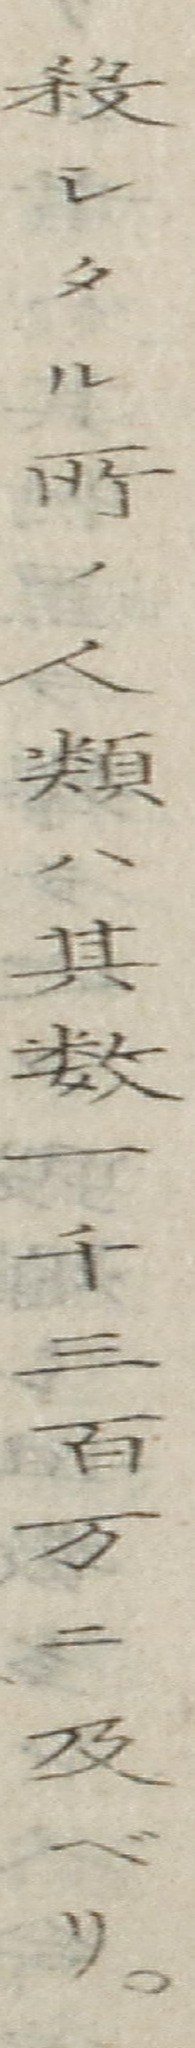殺シタル所ノ人類ハ其数一千三百万ニ及ベリ。
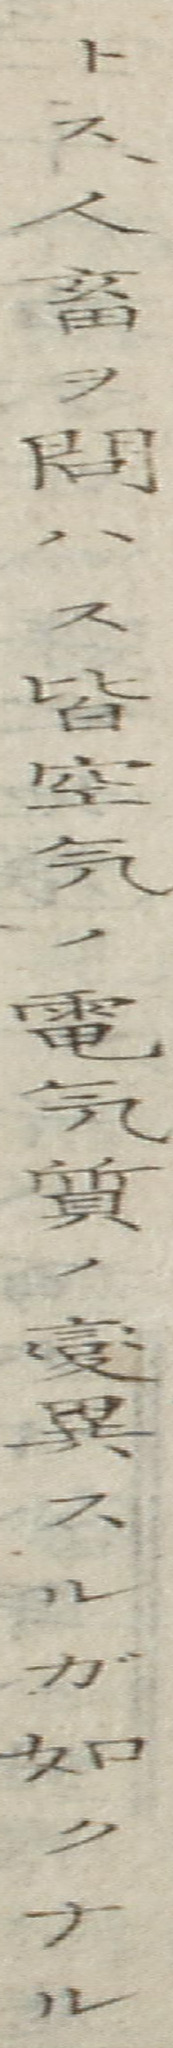トス、人畜ヲ問ハス皆空気ノ電気質ノ変異スルガ如クナル
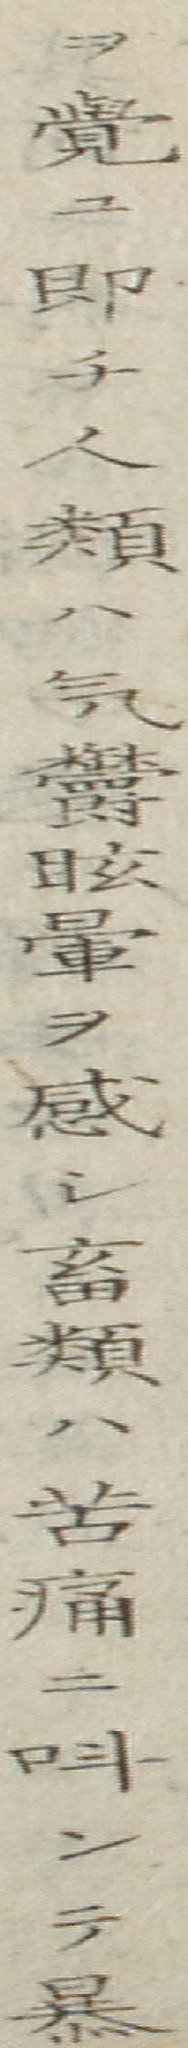ヲ覚ユ即チ人類ハ気欝眩暈ヲ感シ畜類ハ苦痛ニ叫ンテ暴
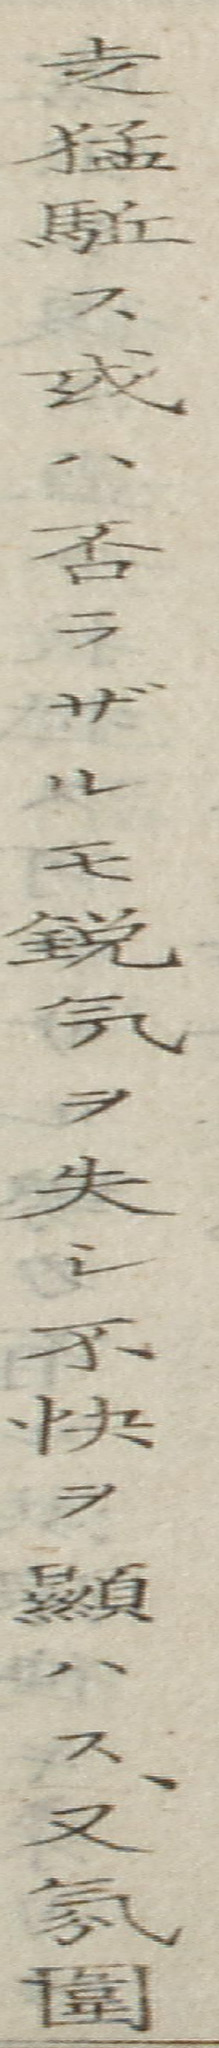走猛駈ス或ハ否ラザルモ鋭気ヲ失シ不快ヲ顕ハス、又氛圍
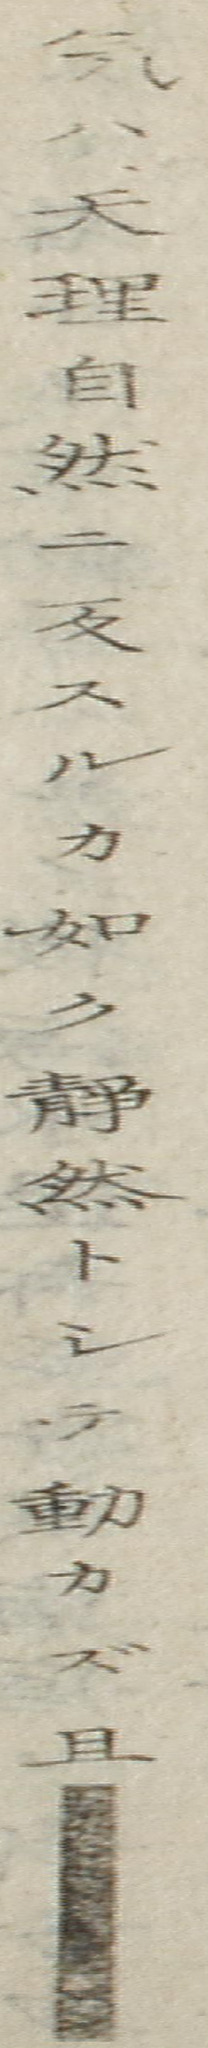気ハ天理自然ニ反スルカ如ク静然トシテ動カズ且
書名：地形論　巻二
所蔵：東京大学地震研究所図書室 Earthquake Research Institute Library, The University of Tokyo, JAPAN
